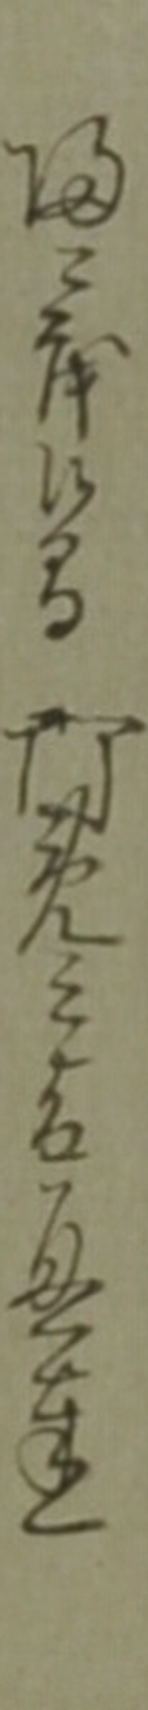帰ニ茂候間御免之旨通達
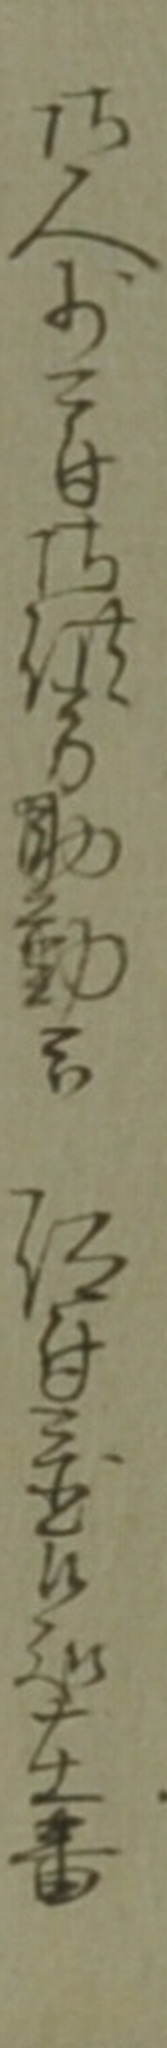御人少ニ付御供方助勤被仰付置候処在番
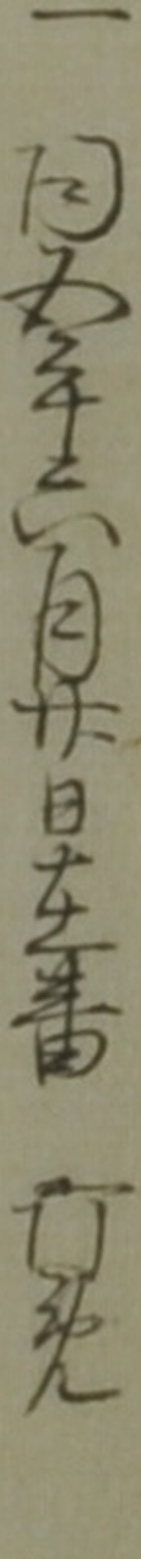一同五午六月廿日在番御免
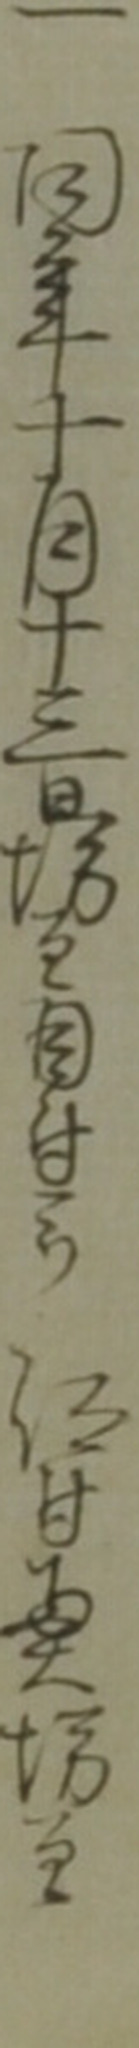一同年十月十三日坊主目付被仰付奥坊主
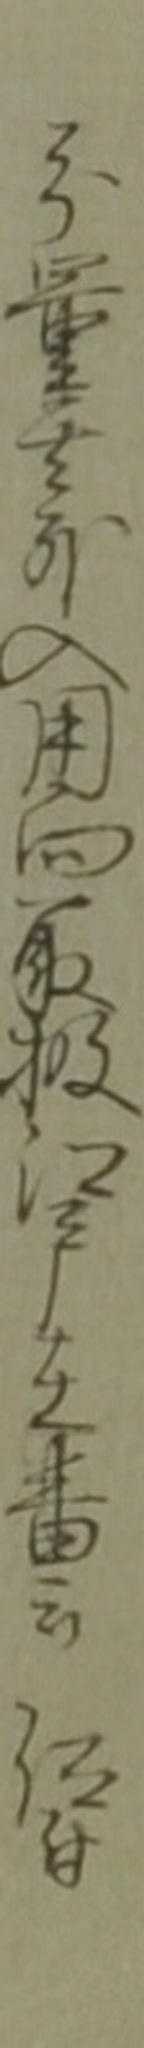分量其外入用向取扱江戸在番被仰付
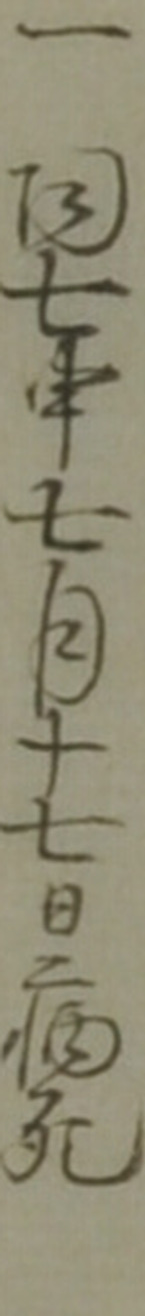一同七申七月十七日病死
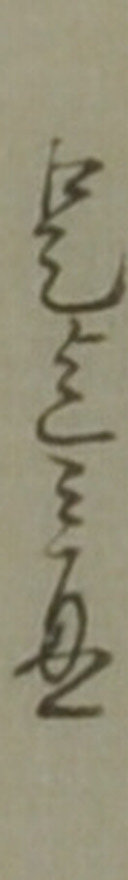是迄之通
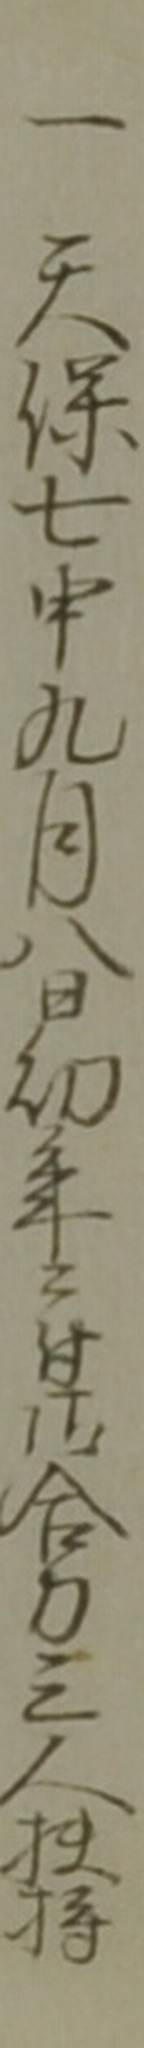一天保七申九月八日幼年ニ付御合力三人扶持
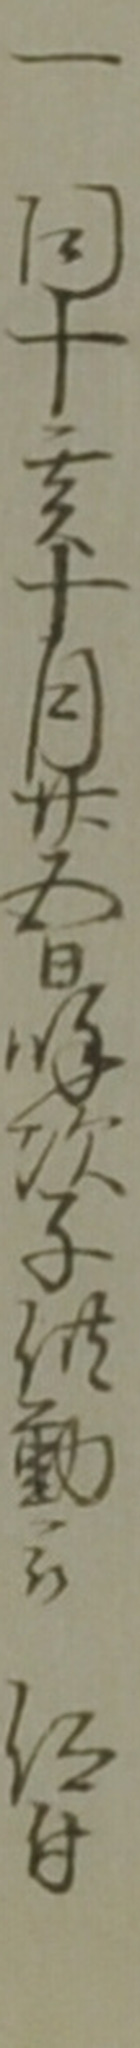一同十亥十月廿五日呼次子供勤被仰付
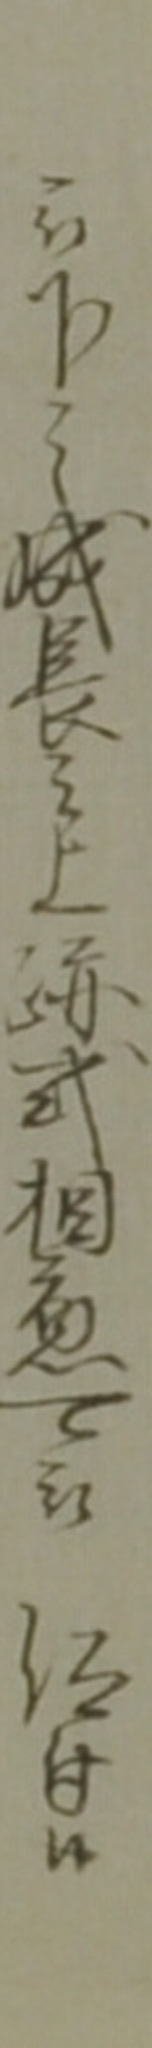被下之成長之上跡式相応可被仰付候
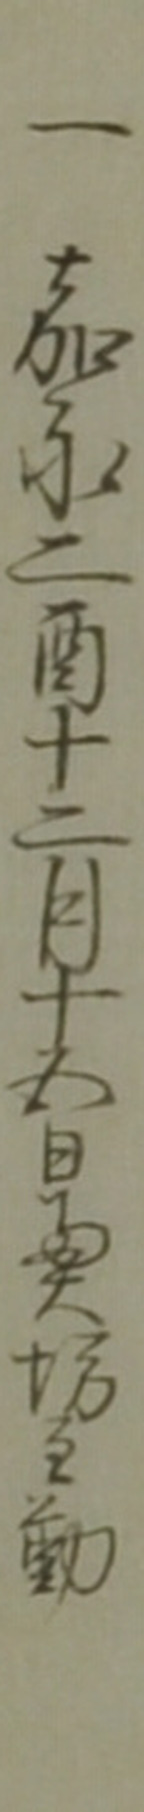一嘉永二酉十二月十五日奥坊主勤
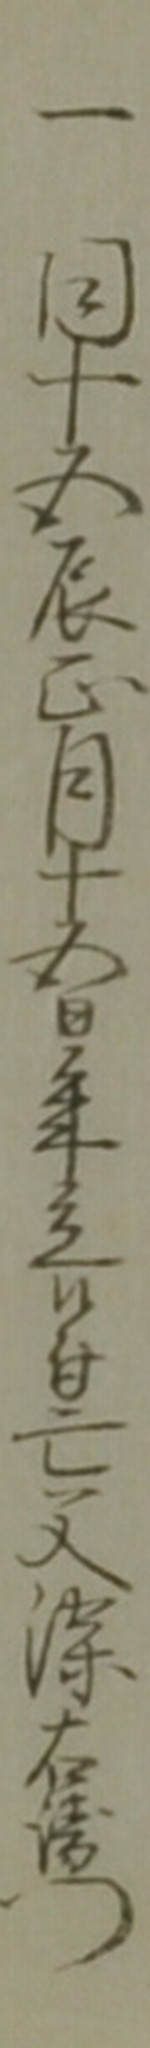一同十五辰正月十五日年立候付亡父柒右衛門
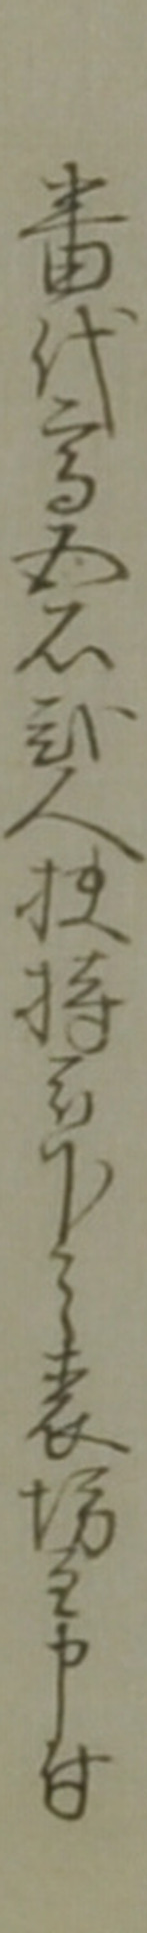番代高五石弐人扶持被下之表坊主申付

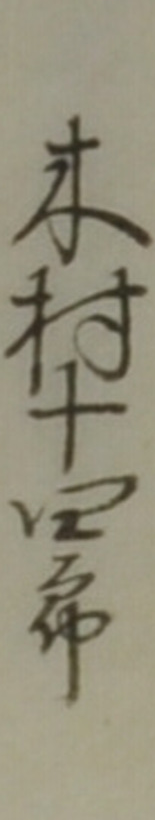木村十四郎
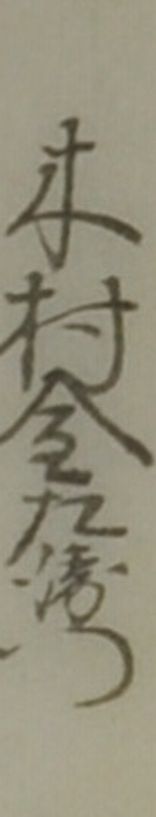木村金左衛門
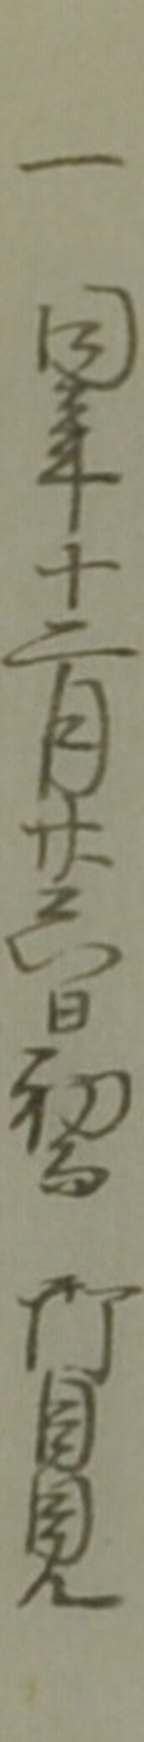一同年十二月廿六日初而御目見
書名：無足諸士勤仕録（九）
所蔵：伊那市立高遠町図書館・合同会社AMANE
